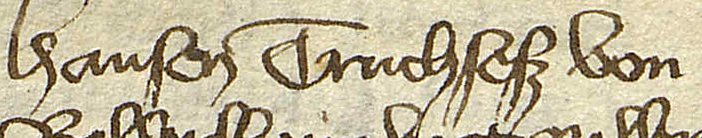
Hanen Truchſeſʒ von
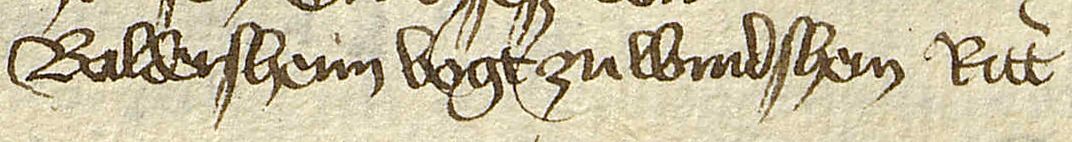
Balderſheim vogt cʒu windſheim Ritt*
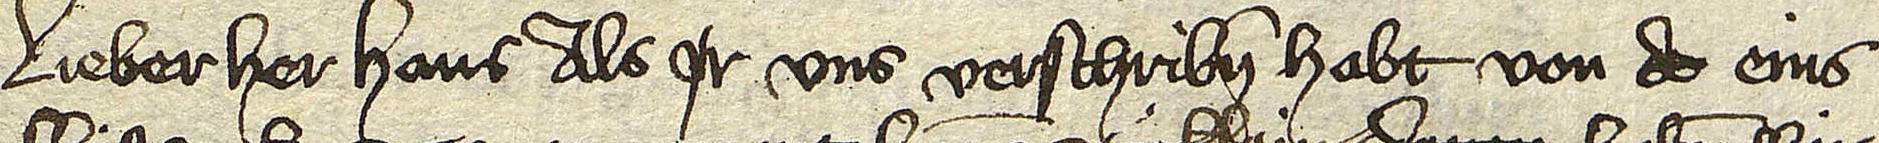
Lieber her hans Als Ir vns verſchribn* habt von de eins
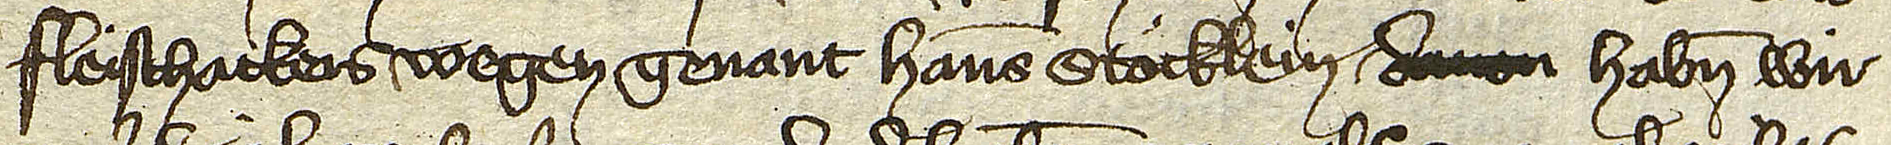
fleiſchackers wegen genant hans* Stöcklein / dauon habn* wir
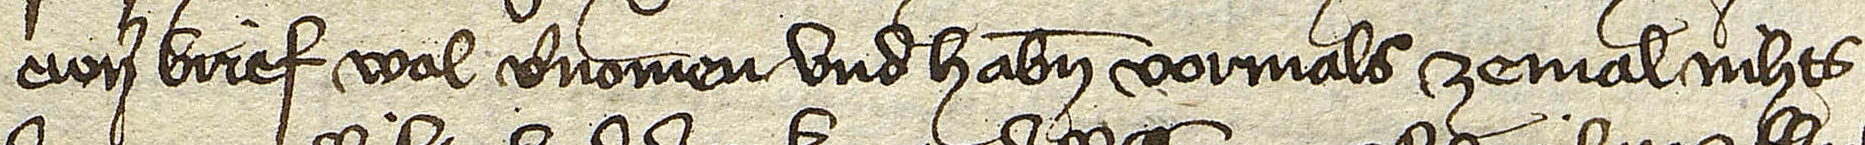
ewn* brief wol v*nomen / vnd habn* vormals cʒemal nihts
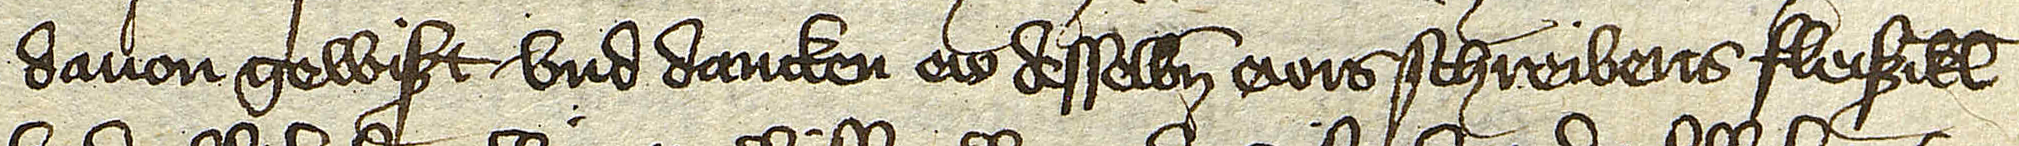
dauon gewiſʒt / vnd dancken ew deſſelbn* ewrs ſchreibens fleiſʒikl*
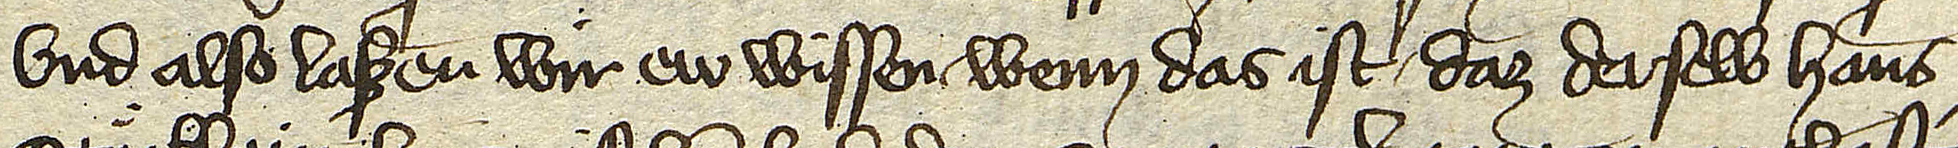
vnd alſo laſʒen wir ew wiſſen / wenn das iſt / daʒ derſelb hans
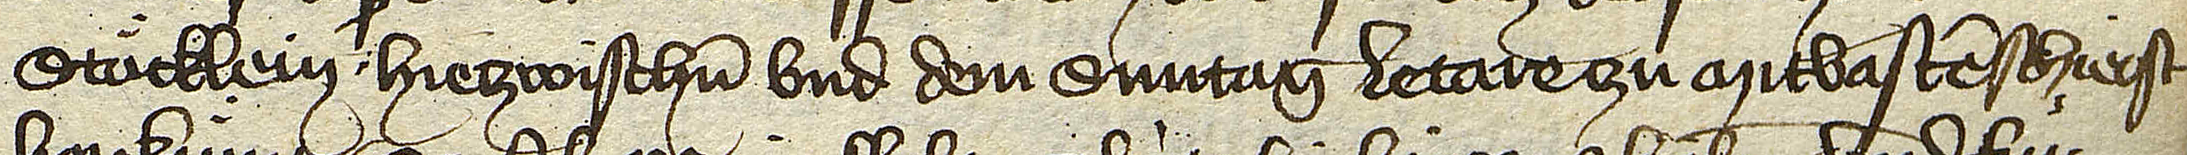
Stöcklein hiecʒwiſchn* vnd dem Suntag Letare cʒu Mitvaſte* ſchierſt
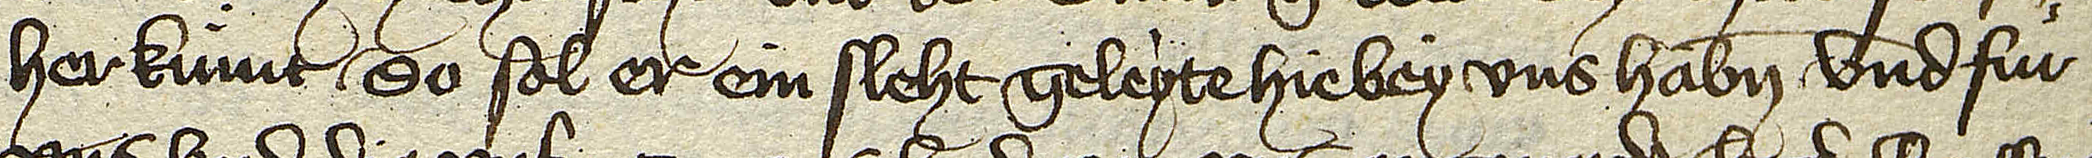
her kümt / So ſol er ein ſleht geleyte hie bey vns habn* / vnd für
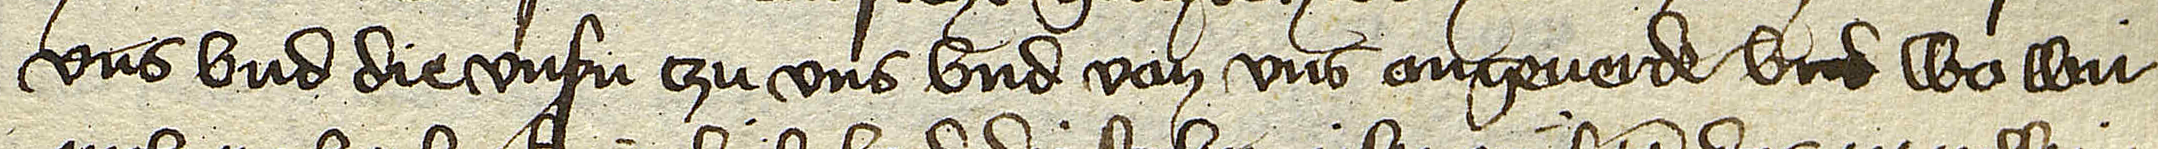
vns vnd die vnſ*n cʒu vns vnd von vns ongeuerde / vnd wo wir
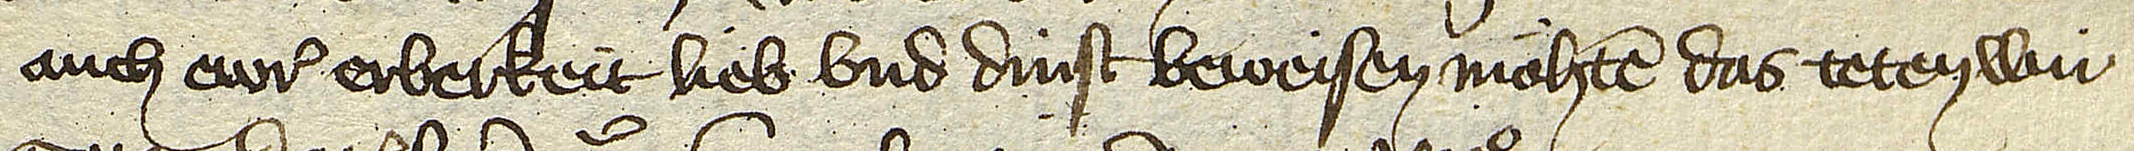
auch ewr* erberkeit lieb vnd dinſt beweiſen möhte* das teten wir
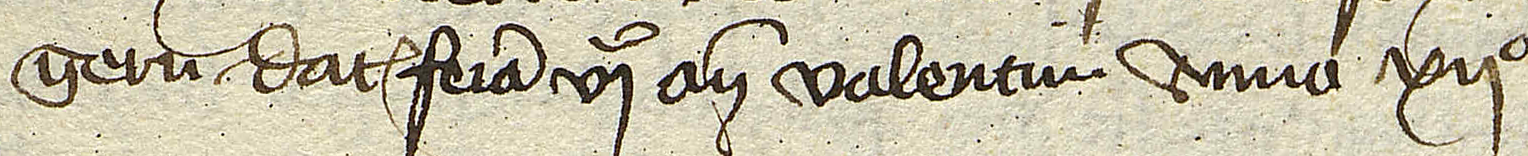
gern / dat* feia* vi* an* valentini Anno xii*
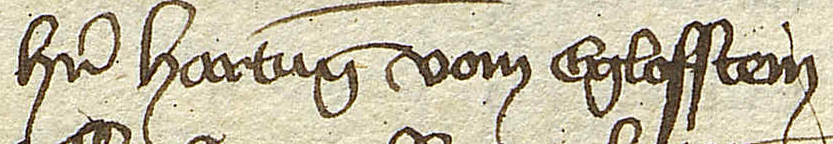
hr* Hartug* von Eglofſtein
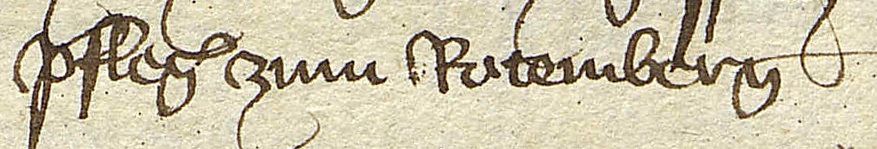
Pfleg* cʒum Rotemberg
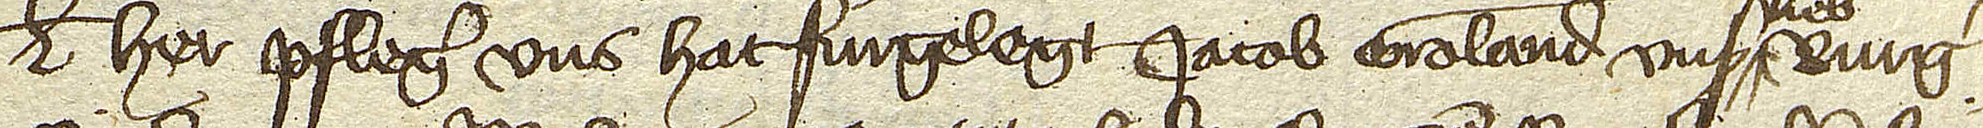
L* her pfleg* vns hat fürgelegt Iacob Groland vnſ* Burg*
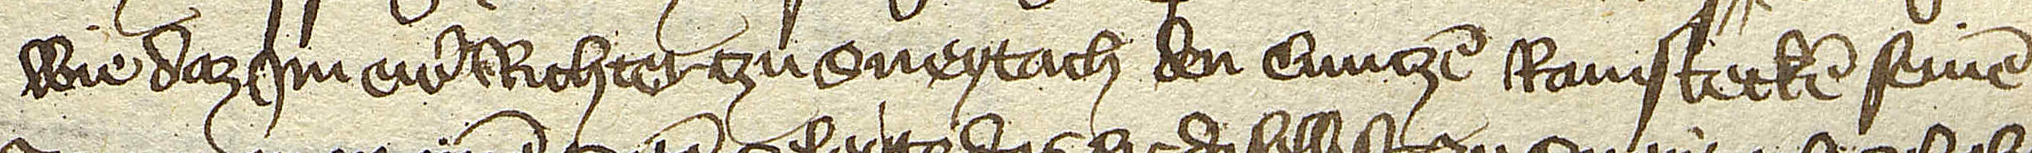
wie daʒ Im ew* Richter cʒu Sneytach den Cuncʒe* Ramſtecke* ſeine*
